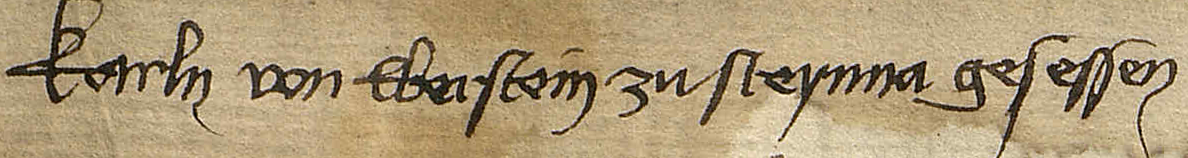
Karln von Eberſtein ʒu ſteynna geſeſſen
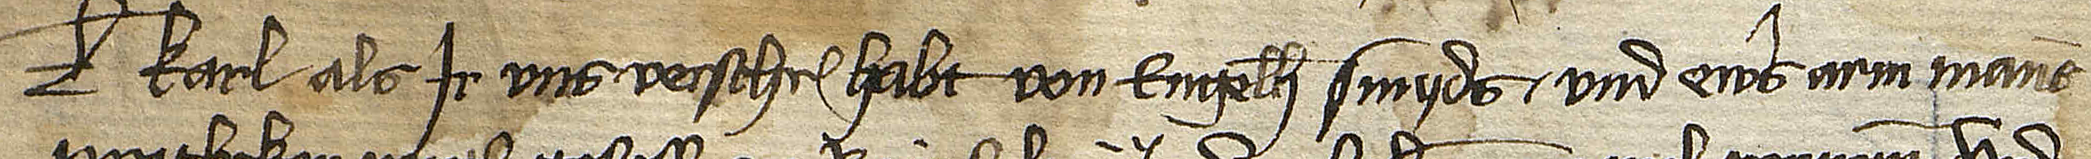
L* Karl als Ir vns verſchr* habt von Engelh* ſmyds / vnd ew*s arm mans*
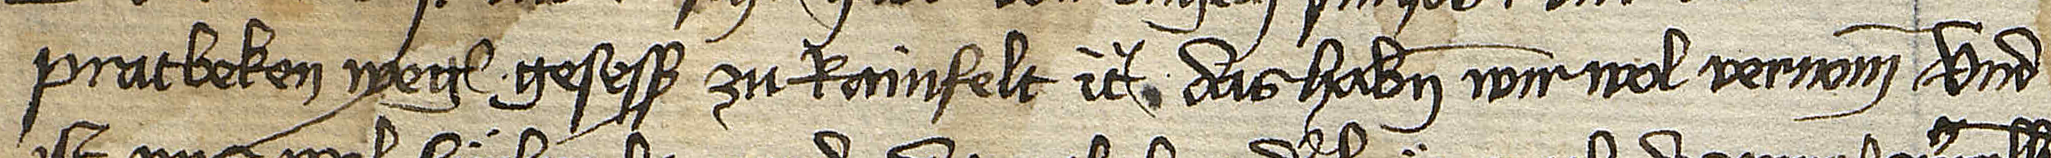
Pratbeken weg* . geſeſſ* ʒu Rainfelt ec* das habn* wir wol vernom* / Vnd
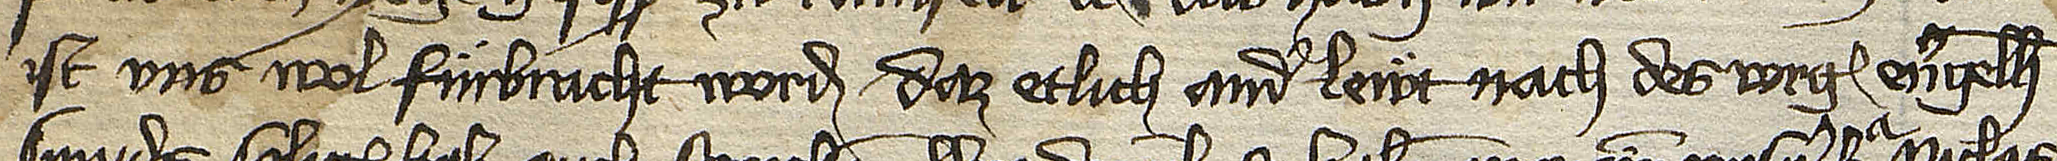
iſt vns wol fürbracht word* / daʒ etlich and* lewt nach des vorg* engelh*
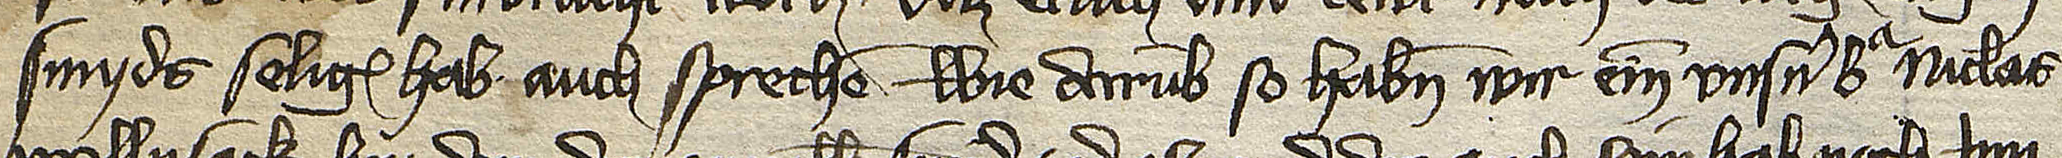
ſmyds ſelig* hab auch ſpreche* wie darub* ſo habn* wir ein* vnſn* b* Niclas
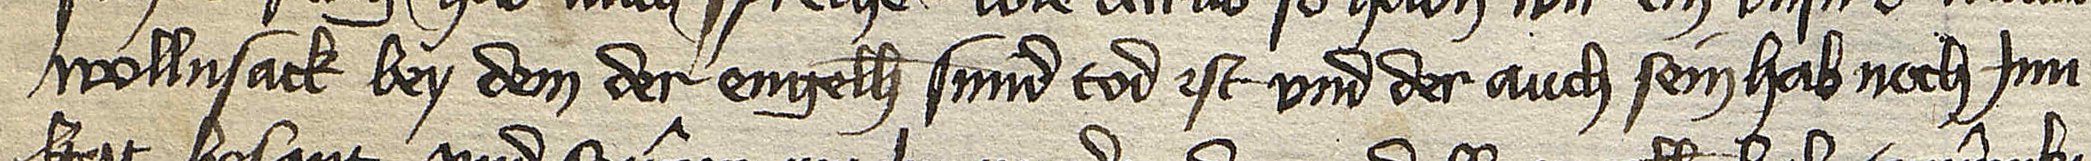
wollnſack bey dem der engelh* ſmid tod iſt vnd der auch ſein hab noch Inn
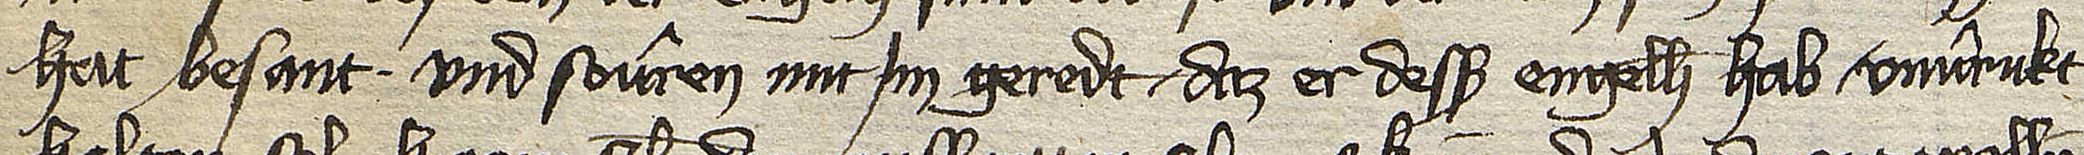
hat beſant . vnd ſou*ren mit Im geredt / daʒ er deſſ* engelh* hab / vnu*rukt
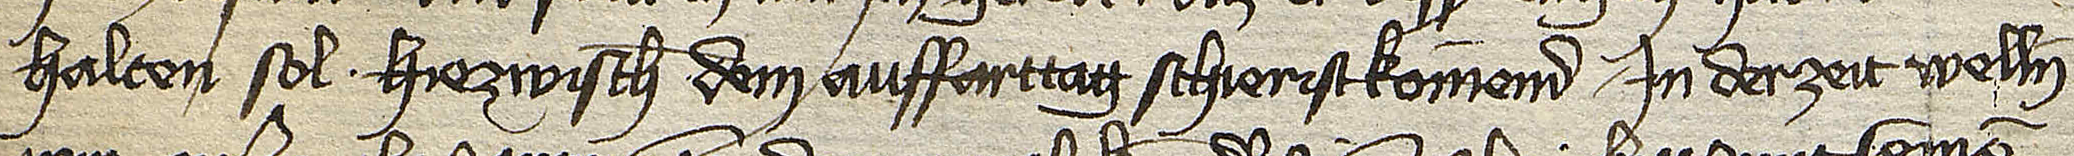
halten ſol . hieʒwiſch* dem auffarttag ſchieriſt kom*end / In derʒeit welln*
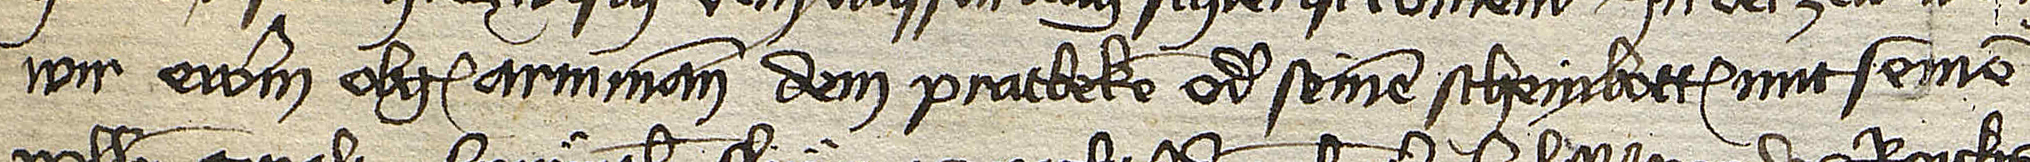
wir ew*m obg* armman* dem pratbeke* od* ſeine* ſcheinbott* mit ſeine*
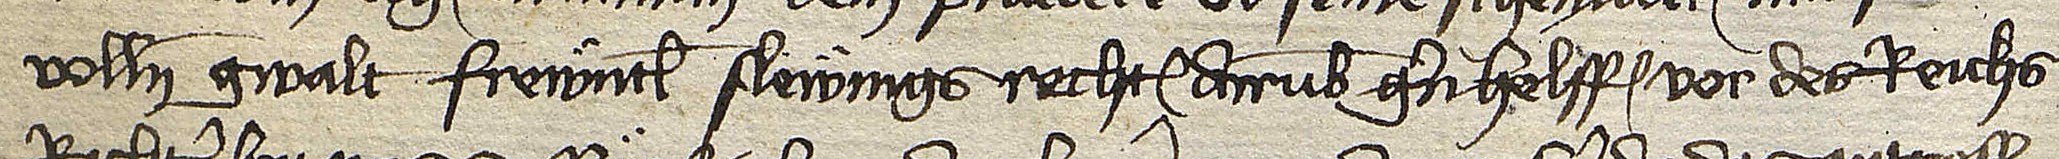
volln* gwalt frewntl* ſlewnigs recht* darub* g*n helff* vor des Reichs
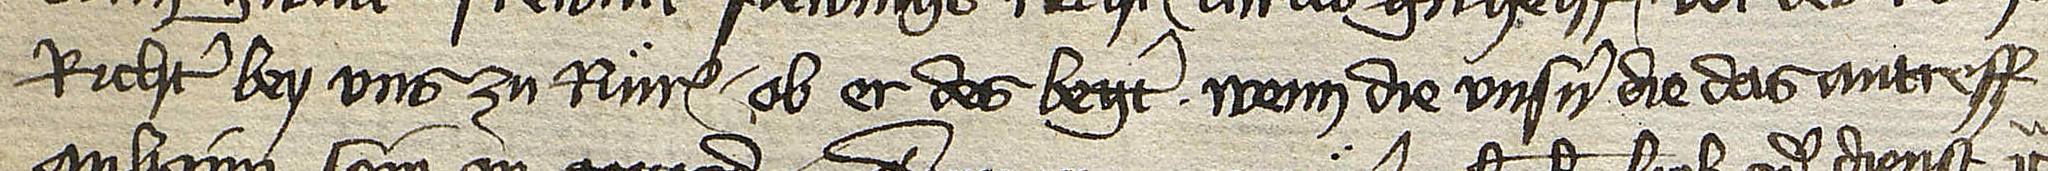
Richt* bey vns ʒu Nür* / ob er des begt* . wenn die vnſn* die das antreff
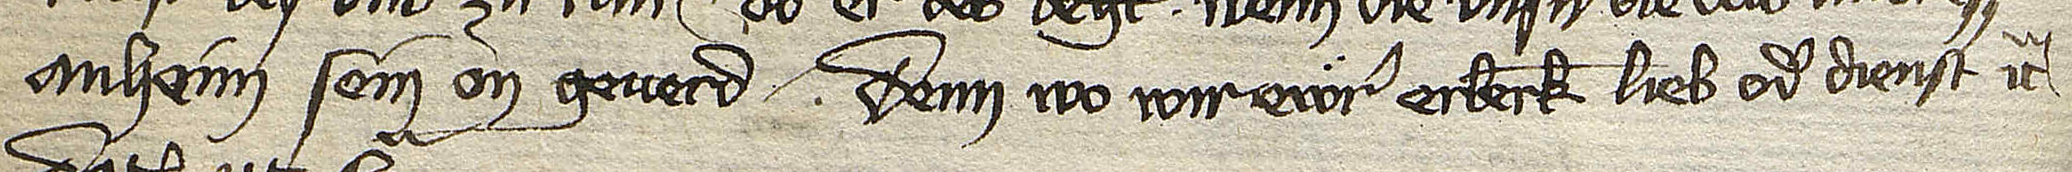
anheim ſein on geuerd / . Denn wo wir ewr* erberk* lieb od* dienſt ec*
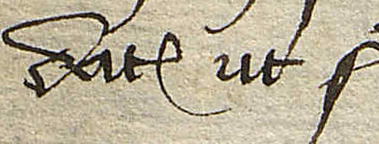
Dat* ut ſ*
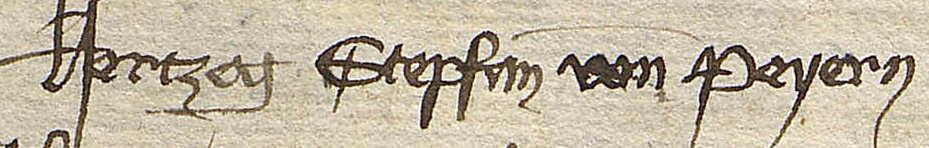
Hercʒog Stepfan von Peyern
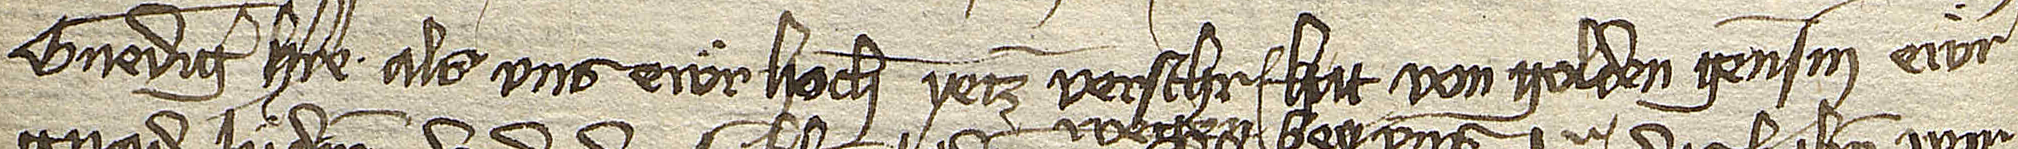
Gnedig* hr*e . als vns ewr hoch* yecʒ* verſchr* hat von golden genſin* ewr*
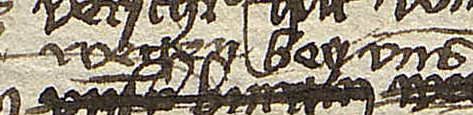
wegen bey vns
